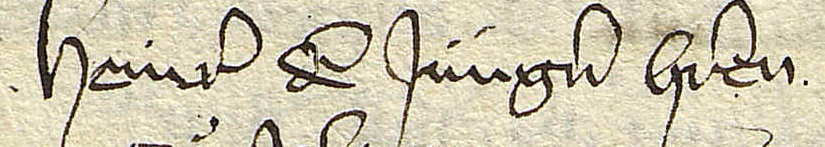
Heinr* d* Iüngn* hr*en
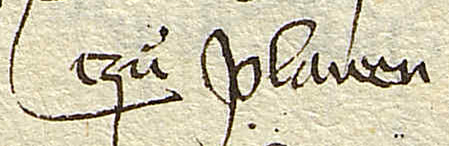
cʒü Plawen
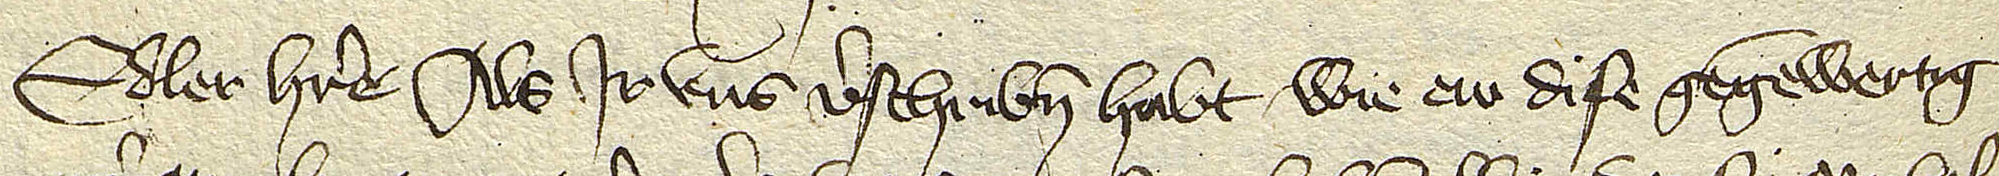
Edler hr*e Als Ir vns v*ſchribn* habt / wie ew diſe gege*wertig
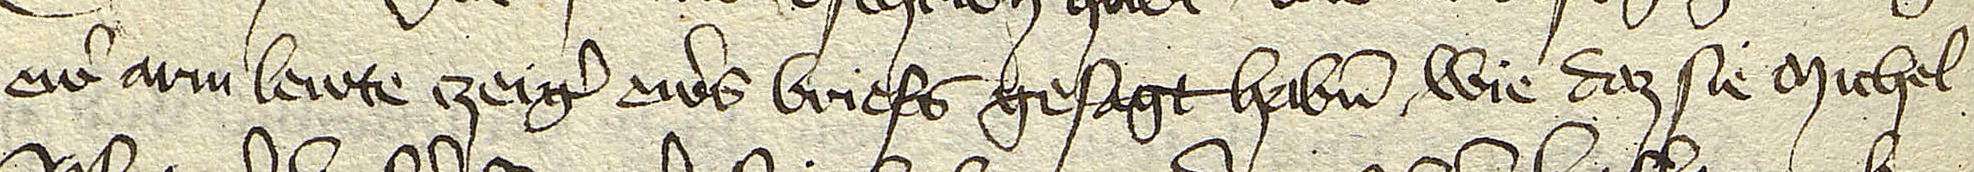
ew* arm lewte cʒeig* ew*s briefs geſagt habn* / wie daʒ ſie Michel
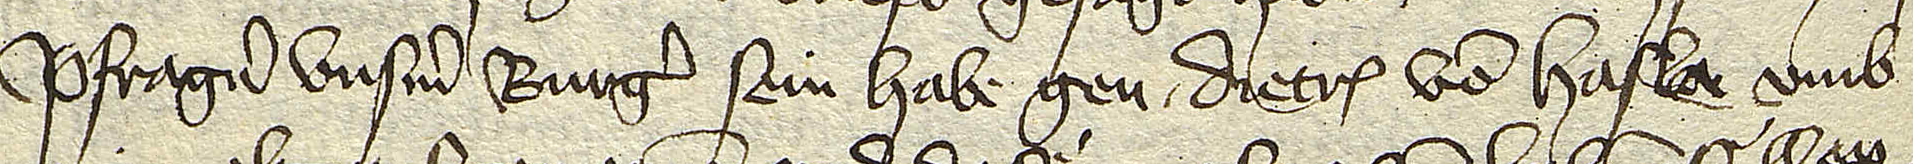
Pfragn* vnſm* Burg* ſein habe gen / Dietr* vo* Haſla vmb
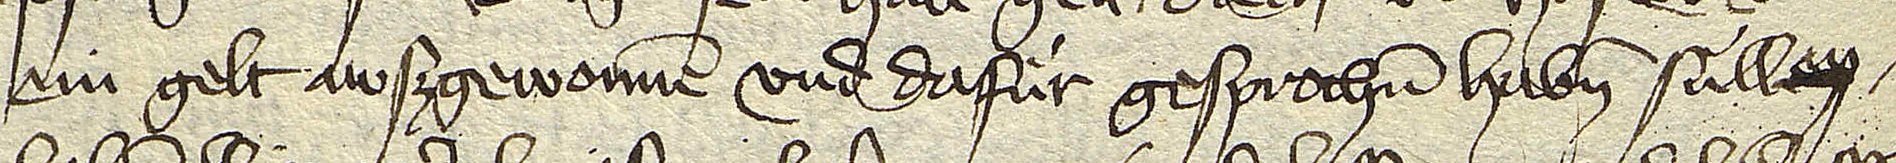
ein gelt awſʒgewonne* vnd dafür geſprochn* habn* ſüllen /
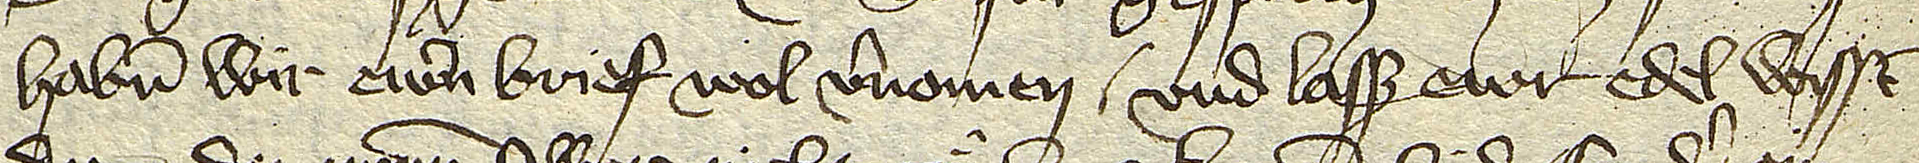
habn* wir ew*n brief wol v*nomen / vnd laſſ* ewr edel wiſſe*
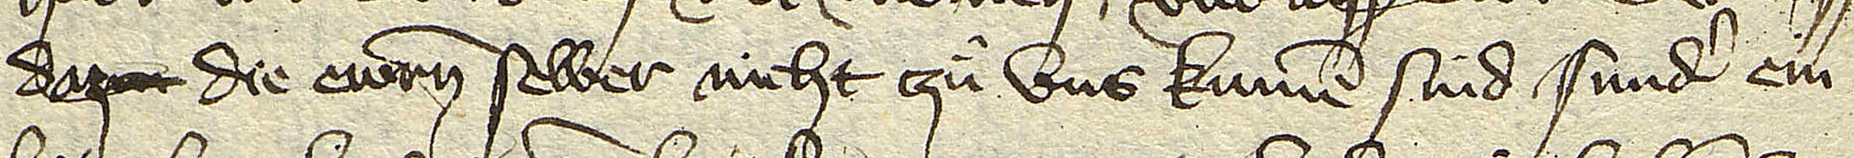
daʒm die ewrn* ſelber nicht cʒü vns kume* ſind / ſund* ein
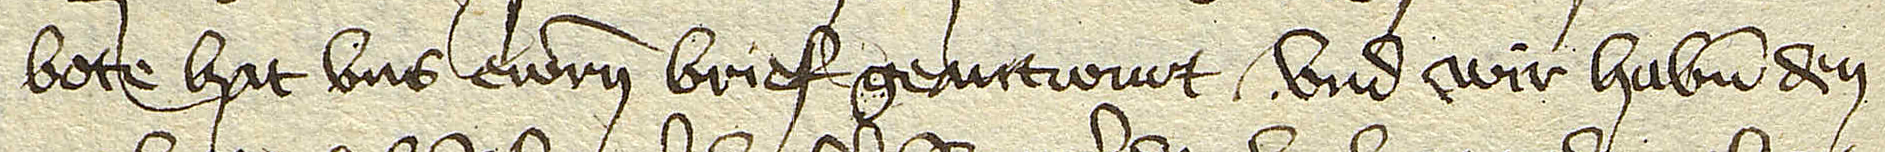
bote hat vns ewrn* brief geantwurt / vnd wir habn* den
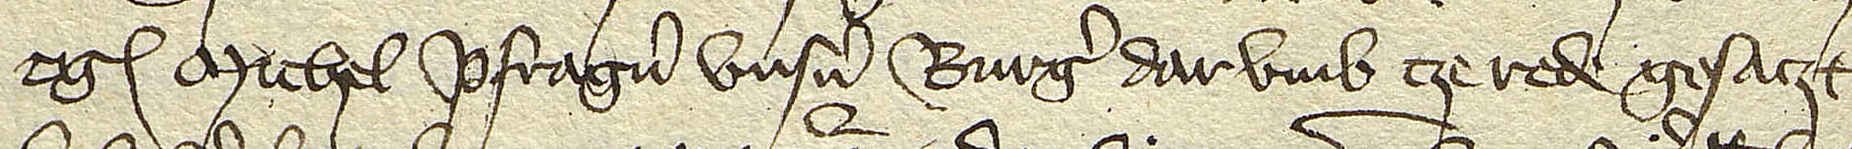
eg* Michel Pfragn* vnſn* Burg* darvmb cʒe rede geſacʒt
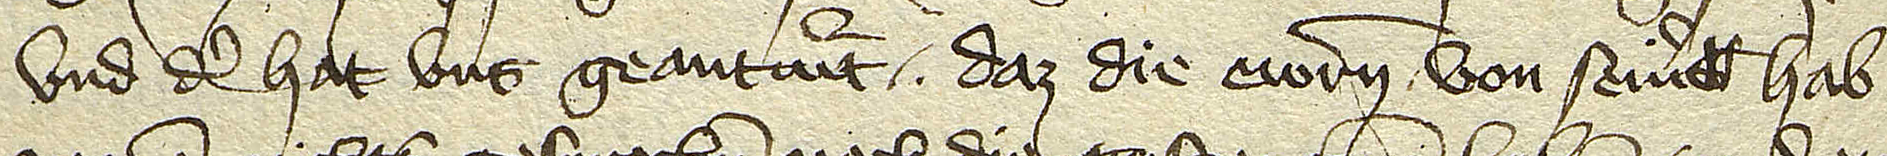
vnd d* hat vns geantwt* /. daʒ die ewrn* / von ſein* hab
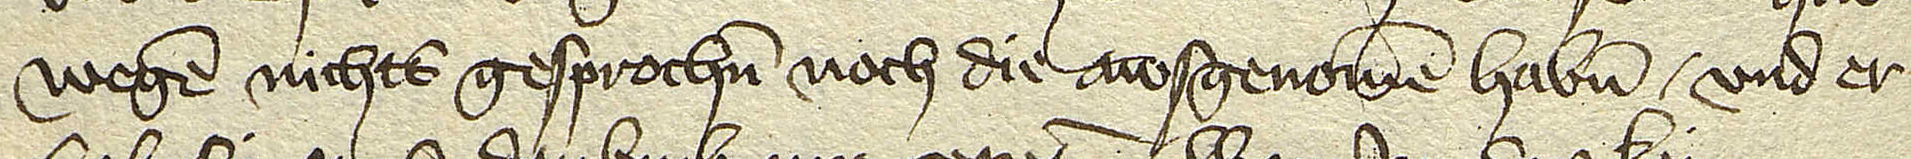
wege* nichts geſprochn* noch die awſgenome* habn* / vnd er
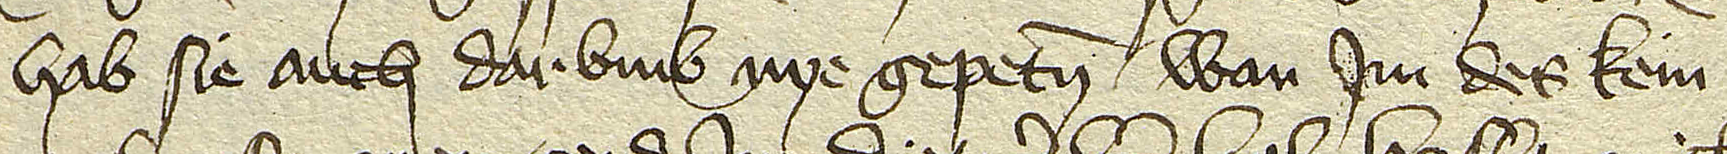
hab ſie auch dar vmb nye gepetn* / wan Im des kein
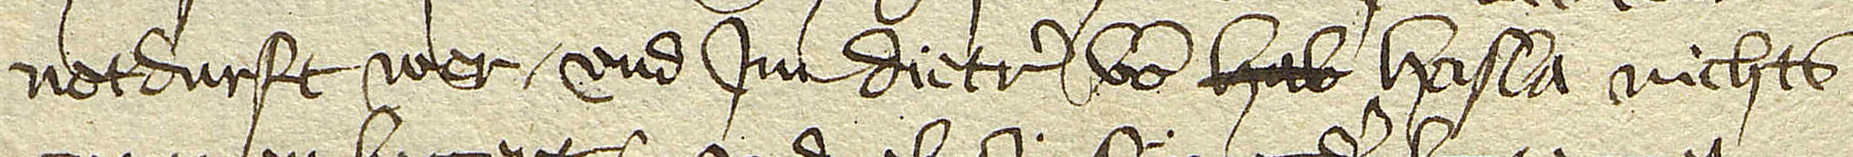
notdurft wer / vnd Im Dietr* vo* Hab Haſla nichts
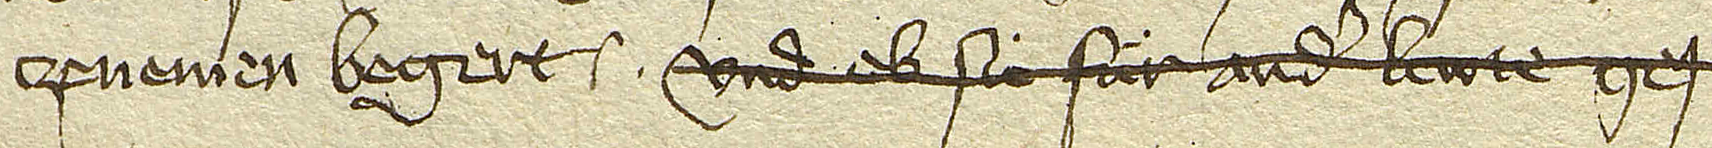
cʒenemen begert / . vnd ob ſie für and* lewte ge
